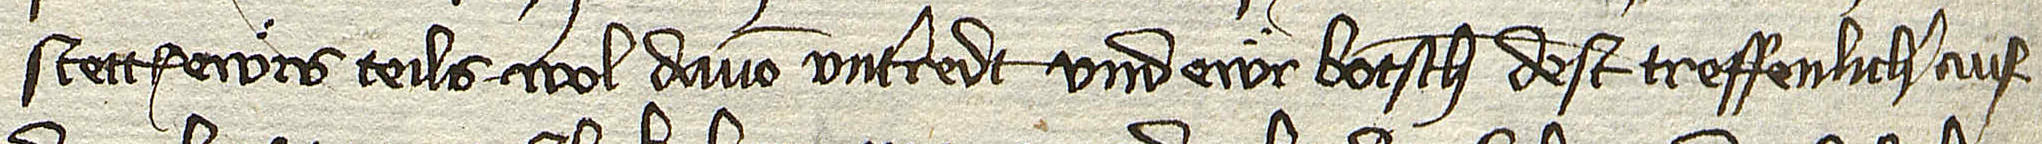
ſtett* eẅrs teils wol dauo* vntr*edt vnd eẅr botſch* deſt treffenlich* auf
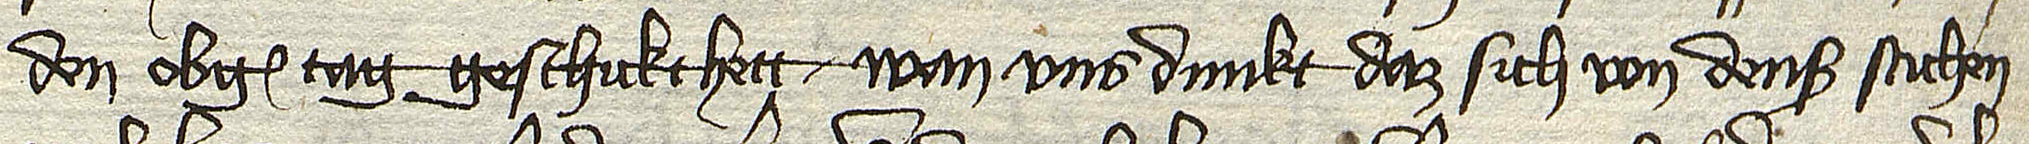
den obg* tag geſchikt hett / wan vns dunkt daʒ ſich von denſ* ſachen
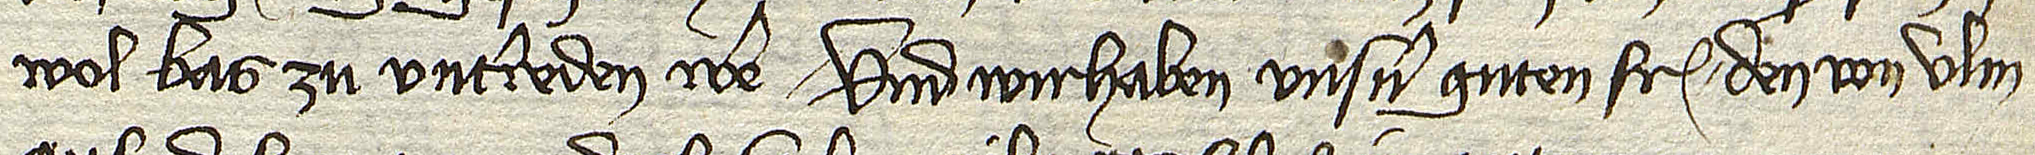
wol bas ʒu vnt*reden we* / Vnd wir haben vnſ*n guten fr* / den von Vlm
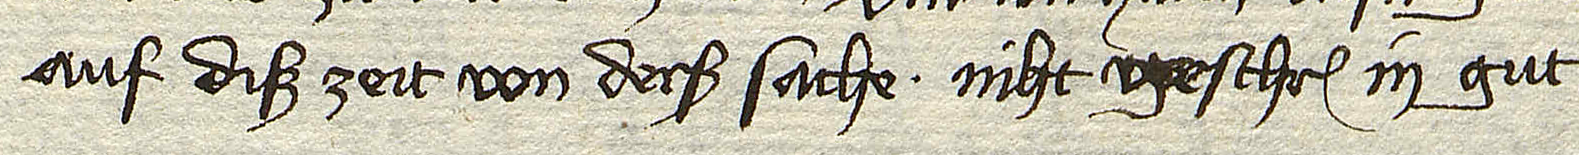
auf diſʒ ʒeit von derſ* ſache . niht geſchr* in gut
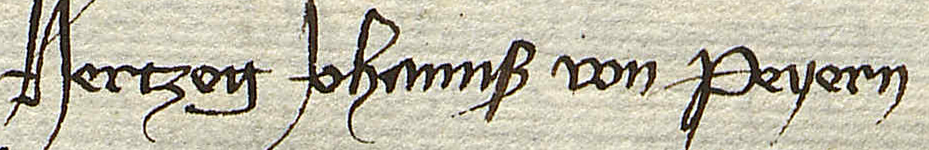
Hercʒog Iohannſ* von Peyern
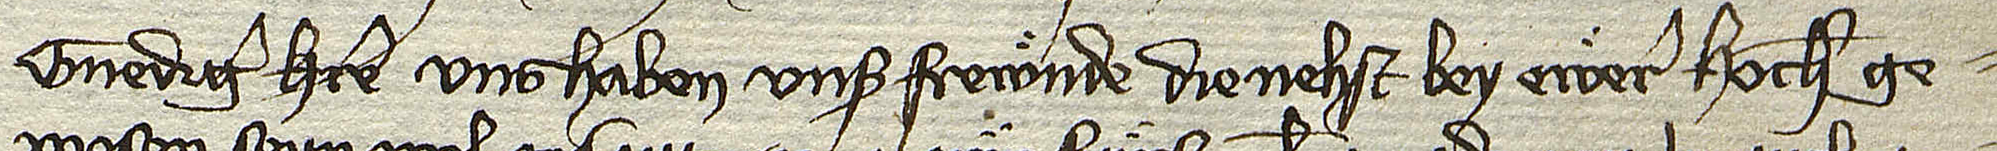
Gnedig* h*re vns haben vnſ* freẅnde die nehſt bey eẅer* hoch* ge =
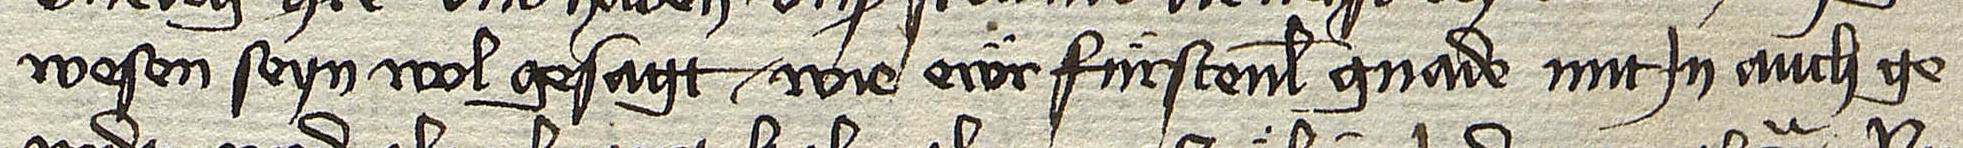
weſen ſeyn wol geſagt / wie eẅr fürſtenl* gnade mit In auch ge =
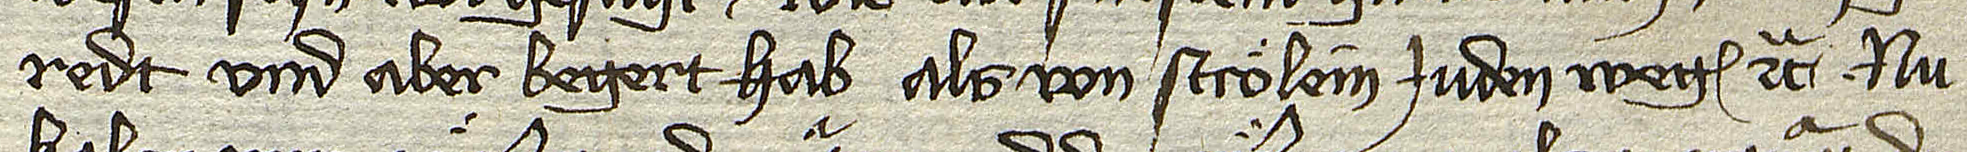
redt vnd aber begert hab als von ſtrölein Iuden weg* ec* . Nu
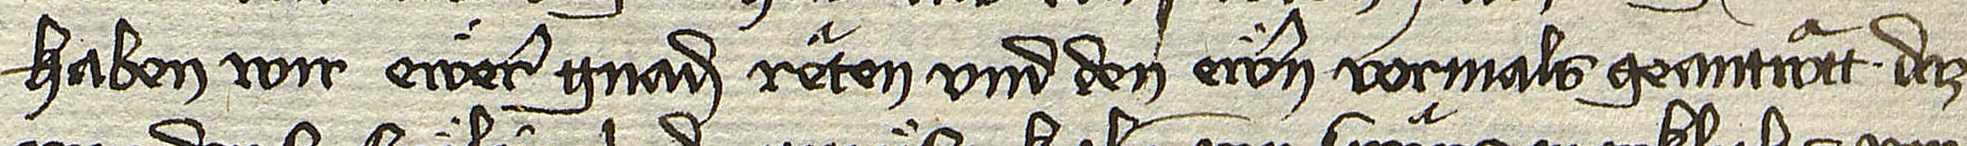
haben wir eẅer* gnad rëten vnd den eẅ*n vormals geantw*tt . daʒ
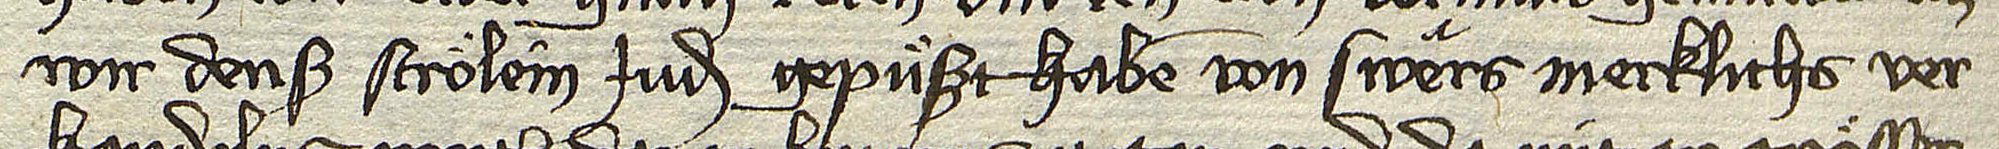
wir denſ* ſtrölein Iud gepüſʒt habe* von ſwërs merklichs ver =
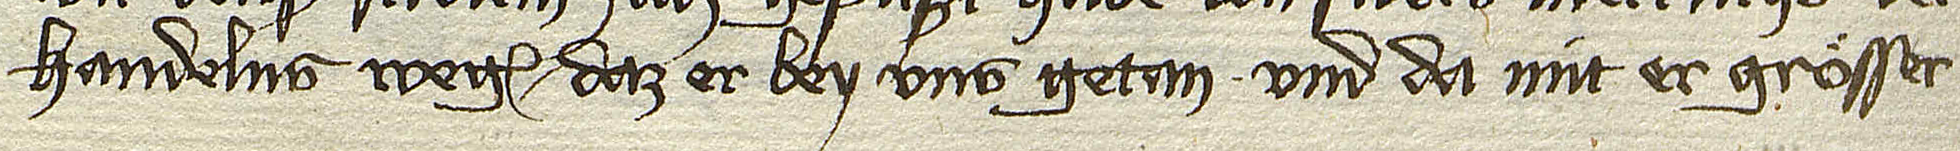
handelns weg* / daʒ er bey vns getan . vnd da mit er gröſſer
